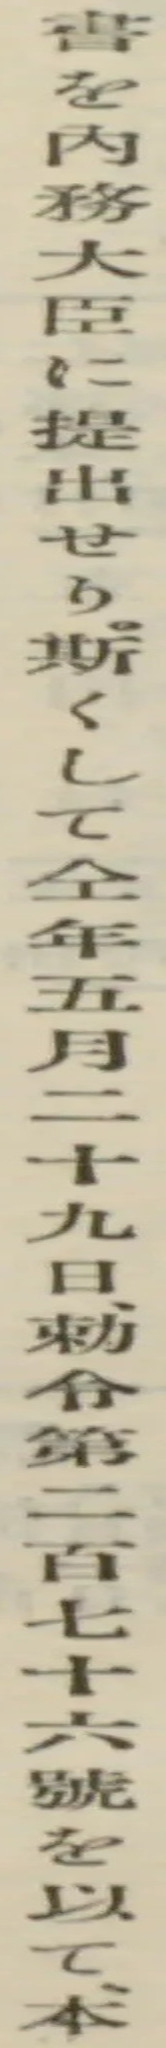書を内務大臣に提出せり。斯くして同年五月二十九日、勅令第二百七十六号を以て、本
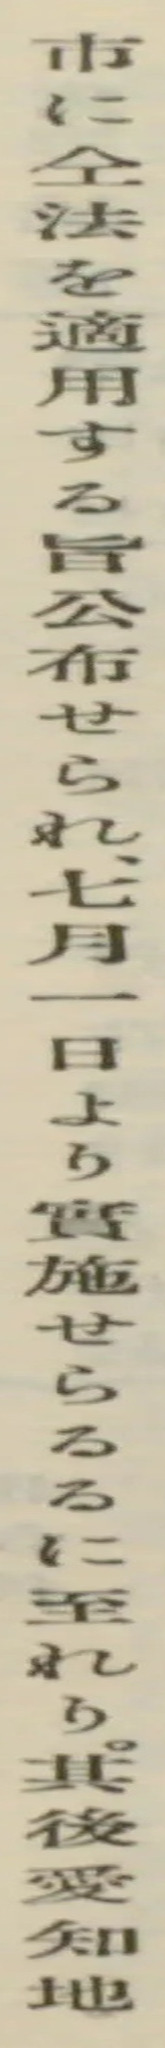市に同法を適用する旨公布せられ、七月一日より実施せらるるに至れり。其後愛知地
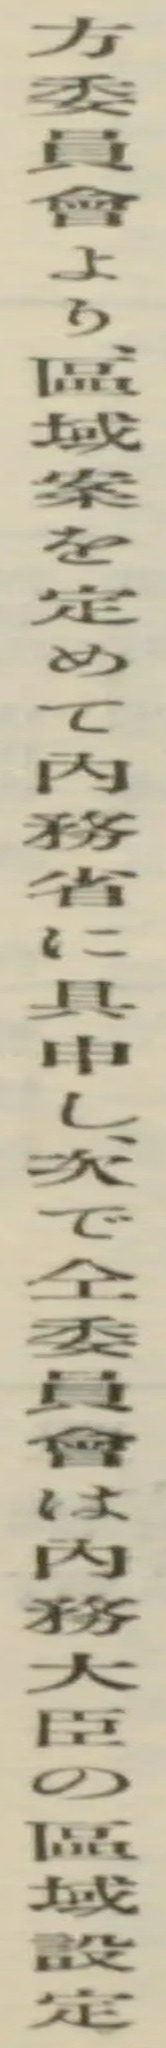方委員会より、区域案を定めて内務省に具申し、次で同委員会は内務大臣の区域設定
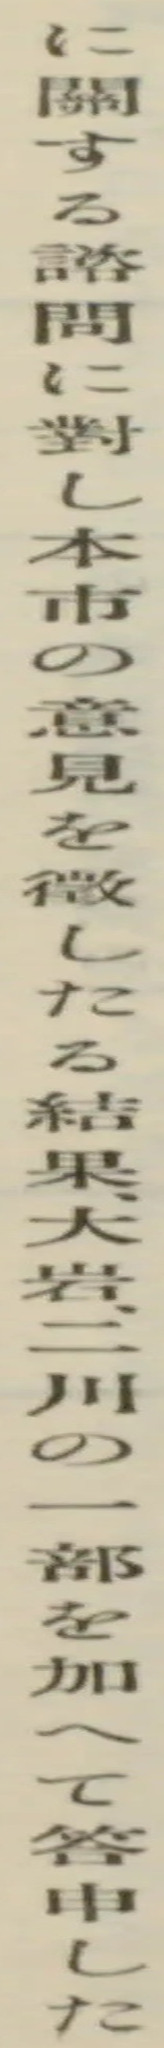に関する諮問に対し本市の意見を徴したる結果、大岩、二川の一部を加へて答申した
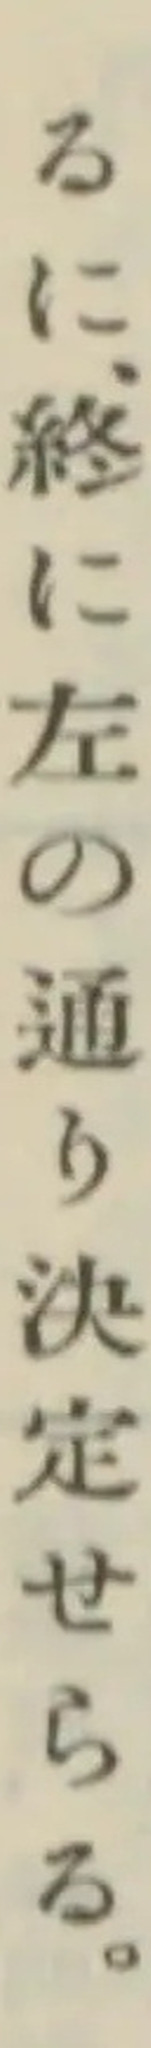るに、終に左の通り決定せらる。
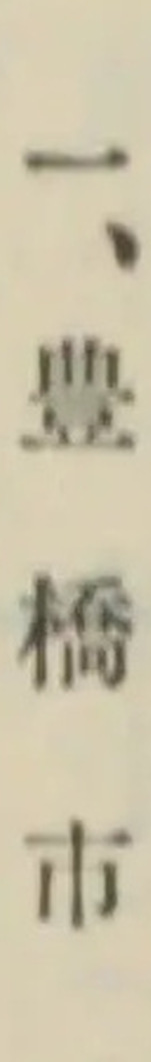一、豊橋市
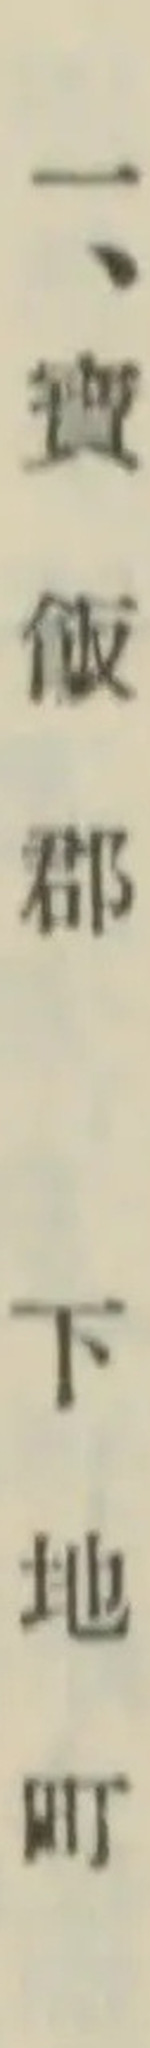一、寶飯郡下地町
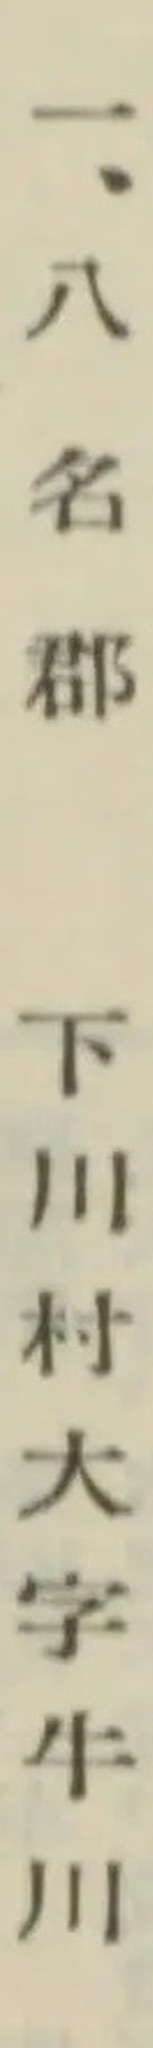一、八名郡下川村大字牛川
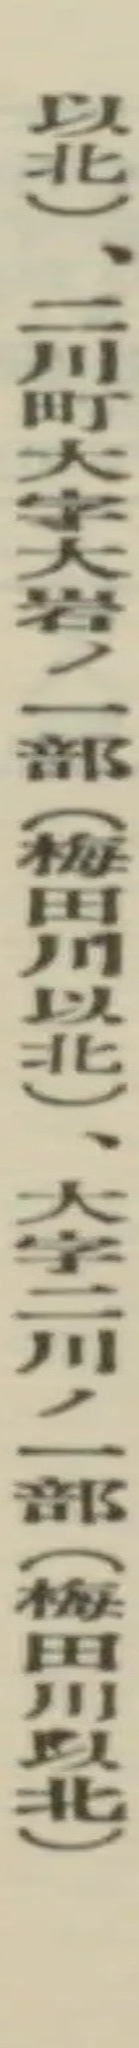以北)、二川町大字大岩の一部(梅田川以北)、大字二川の一部(梅田川以北)
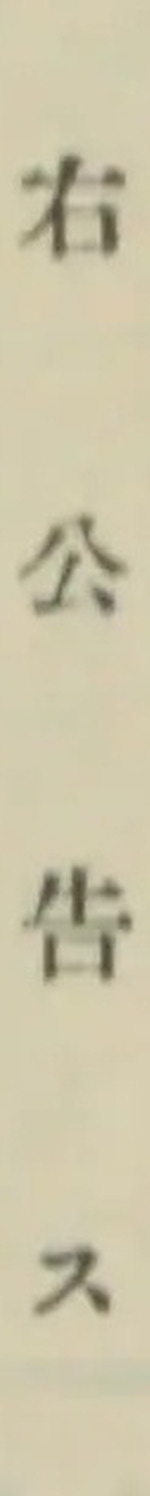右公告す
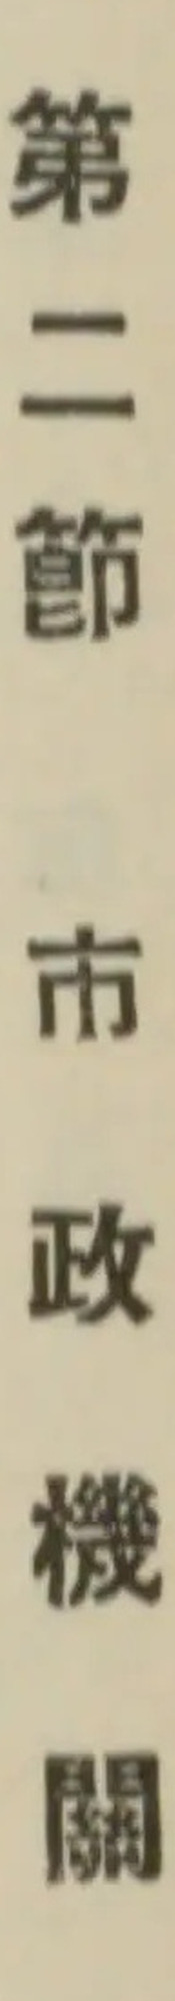第二節市政機関
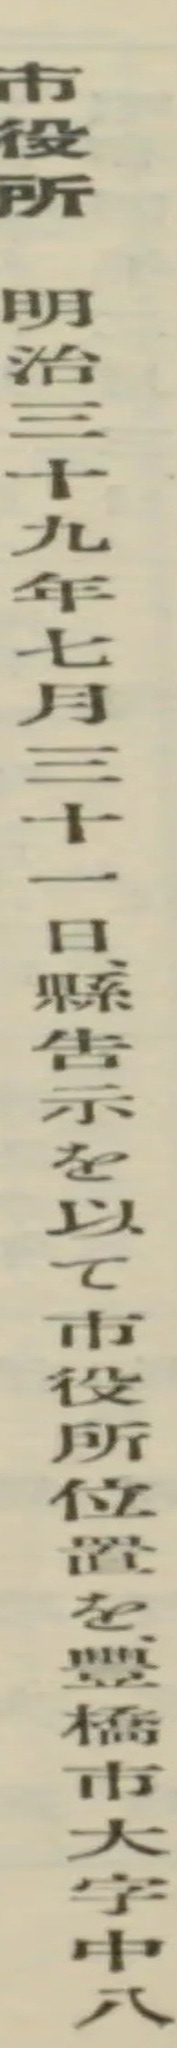市役所明治三十九年七月三十一日、県告示を以て市役所位置を、豊橋市大字中八
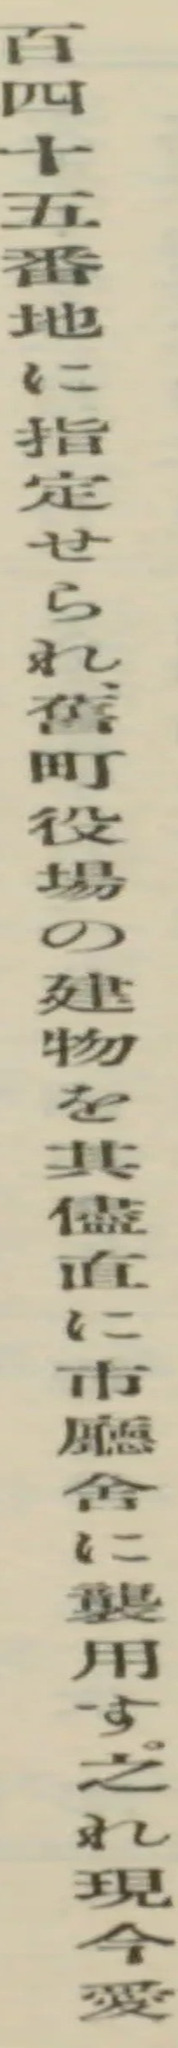百四十五番地に指定せられ、舊町役場の建物を其儘直に市庁舎に襲用す。之れ現今愛
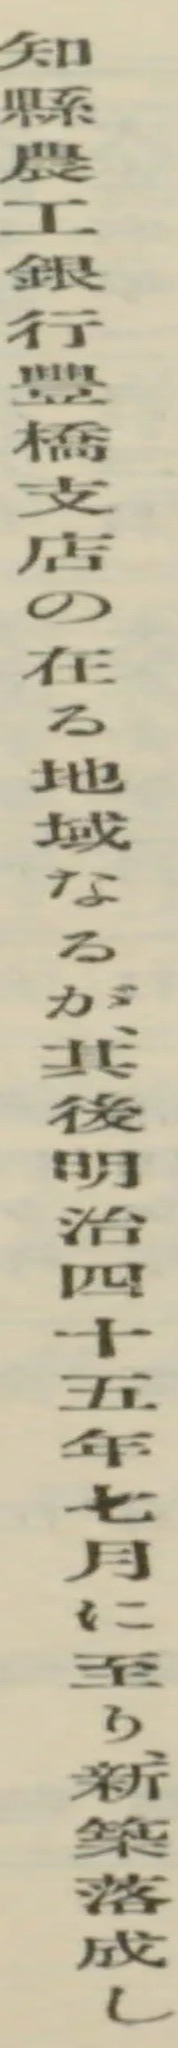知県農工銀行豊橋支店の在る地域なるが、其後明治四十五年七月に至り、新築落成し
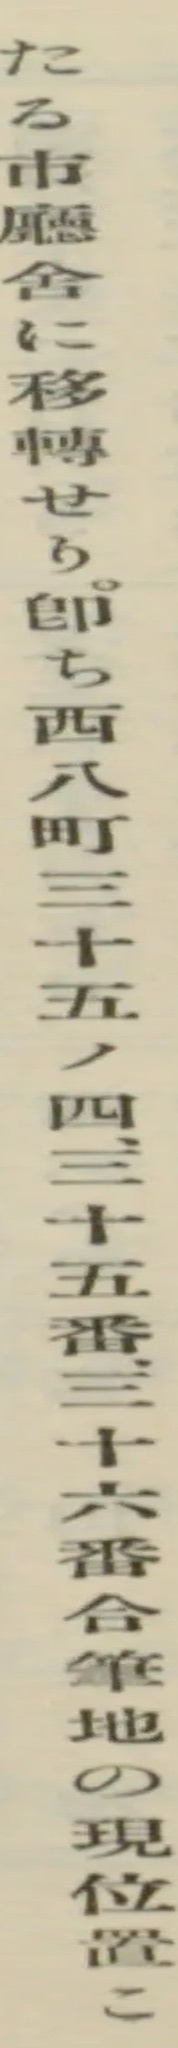たる市庁舎に移転せり。即ち西八町三十五の四、三十五番、三十六番合筆地の現位置こ
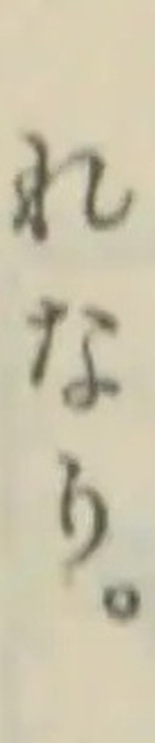れなり。
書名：豊橋市水道誌
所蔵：国立国会図書館 National Diet Library, JAPAN
